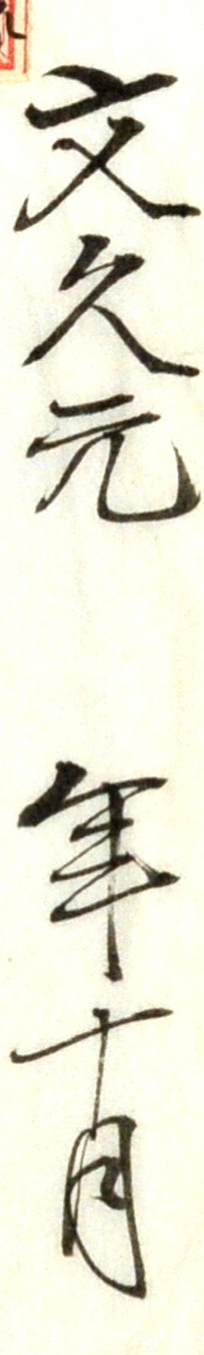文久元年十月
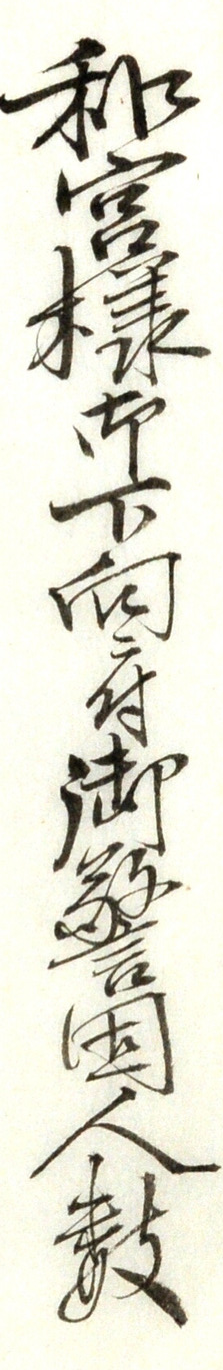和宮様御下向ニ付御警固人数

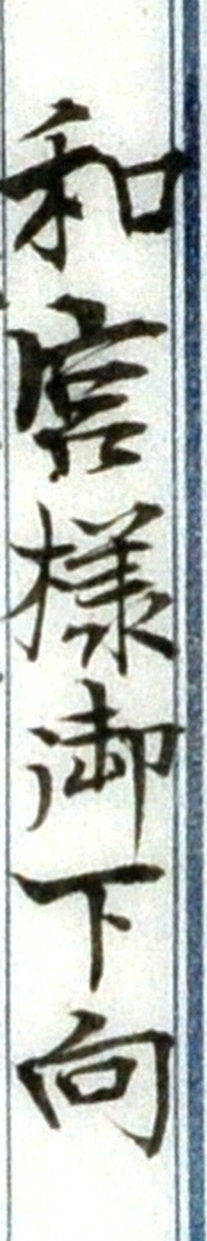和宮様御下向
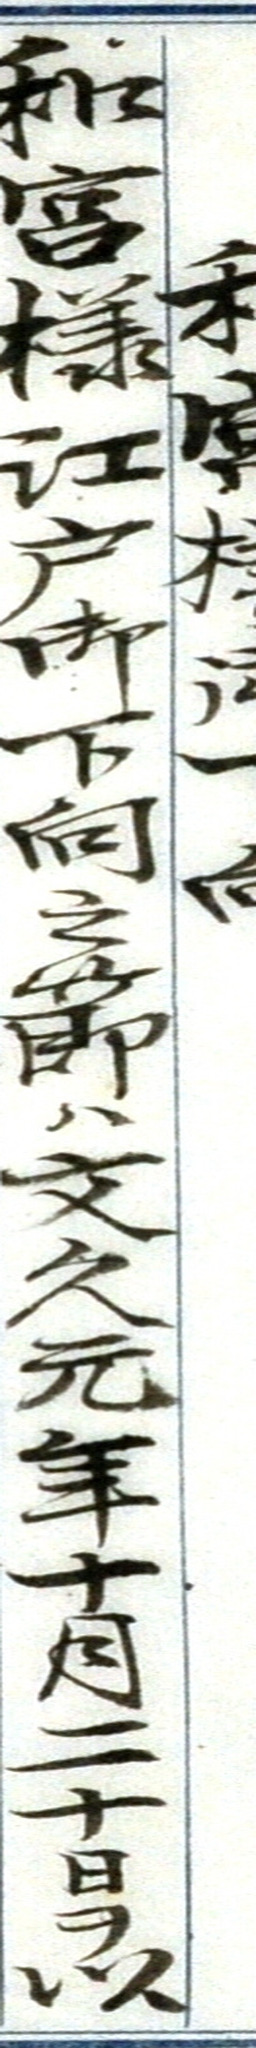和宮様江戸御下向之節ハ文久元年十月二十日ヲ以
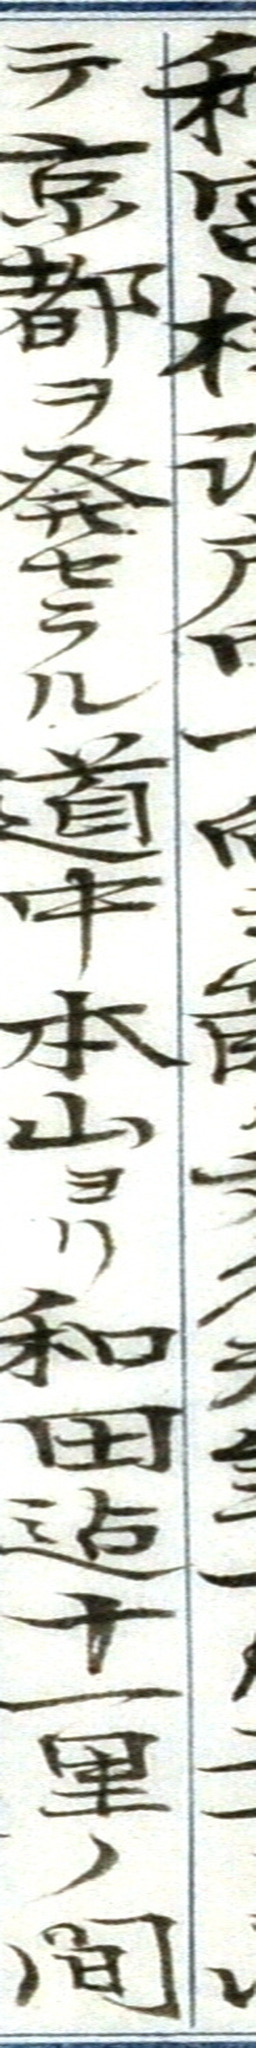テ京都ヲ発セラル道中本山ヨリ和田迄十一里ノ間
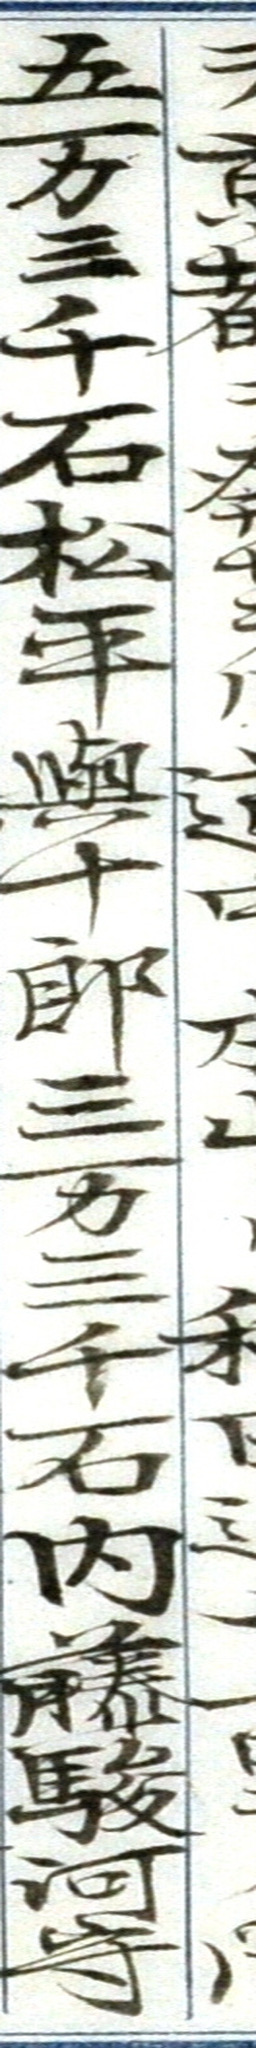五万三千石松平與十郎三万三千石内藤駿河守
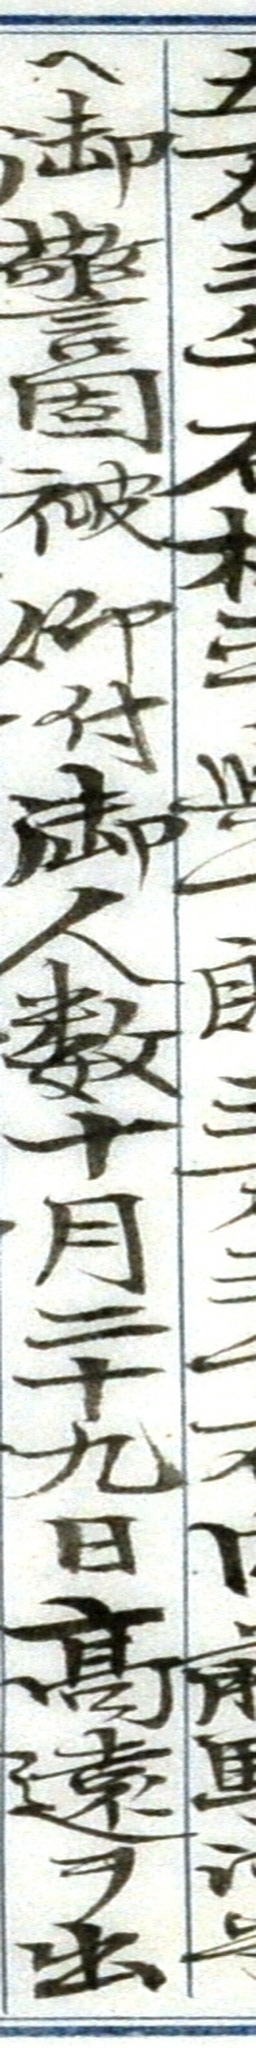ヘ御警固被仰付御人数十月二十九日高遠ヲ出
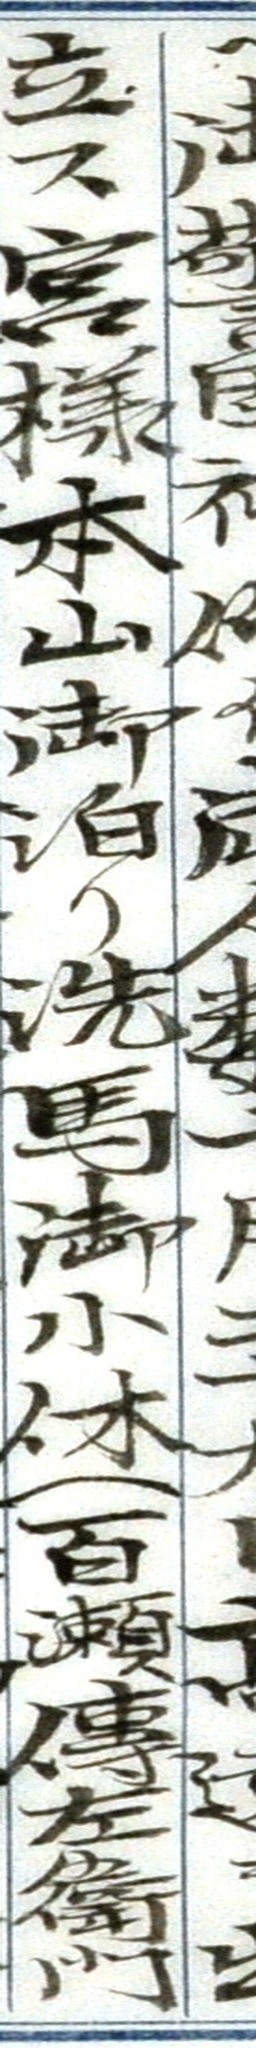立ス宮様本山御泊リ洗馬御小休(百瀬傳左衛門
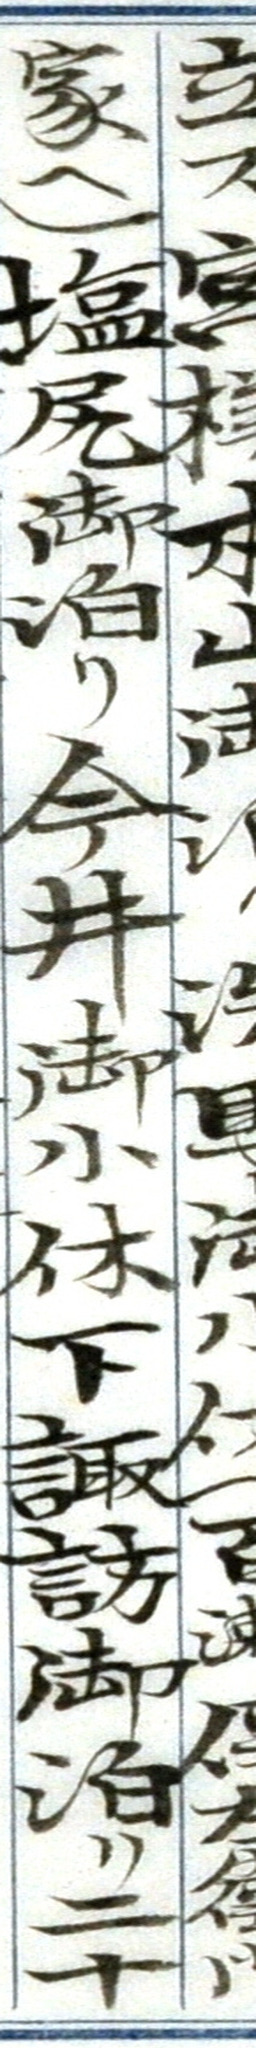家ヘ)塩尻御泊リ今井御小休下諏訪御泊リ二十
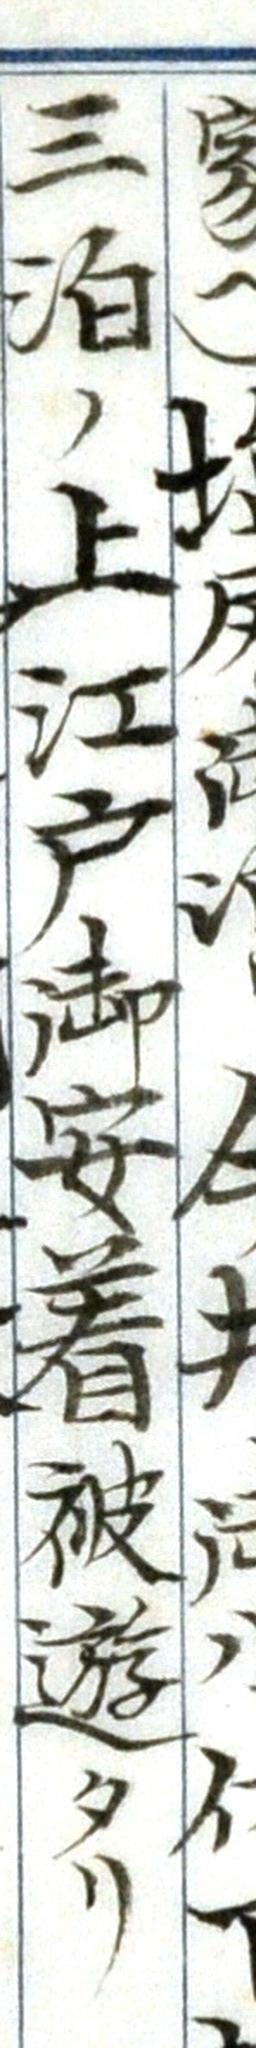三泊ノ上江戸御安着被遊タリ
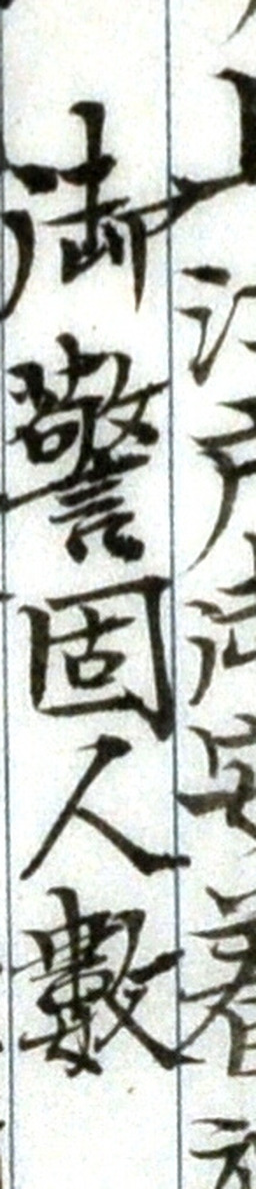御警固人数
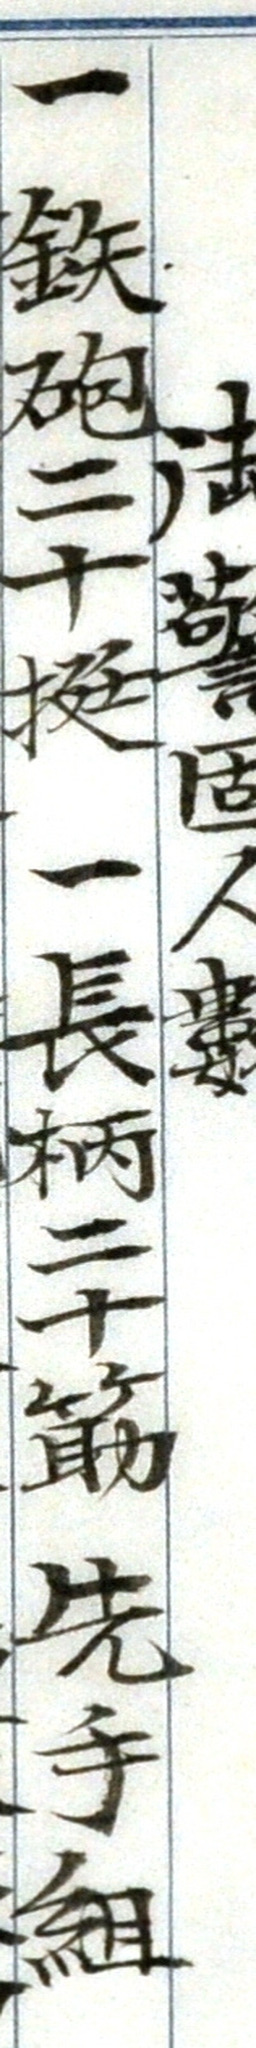一鉄砲二十挺一長柄二十筋先手組
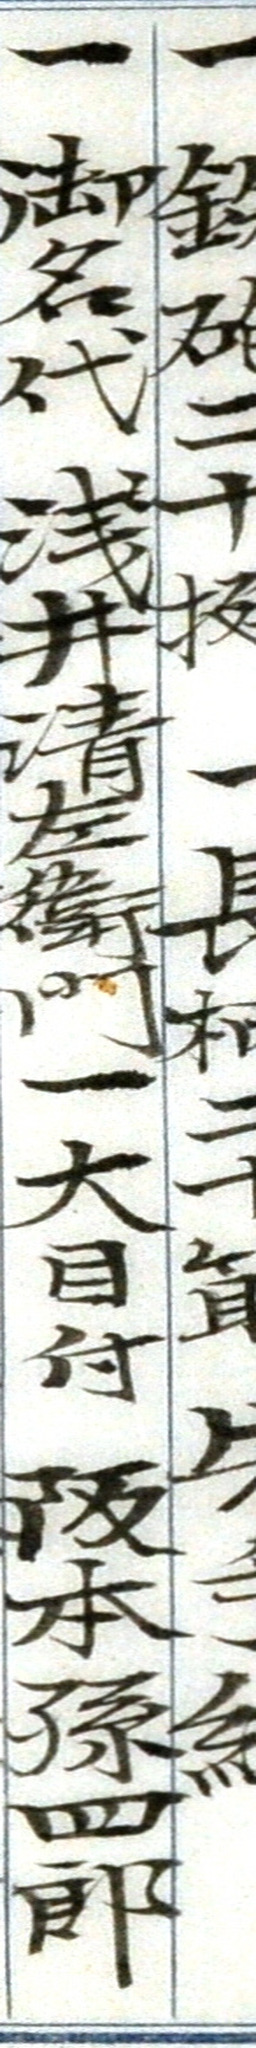一御名代浅井清左衛門一大目付阪本孫四郎
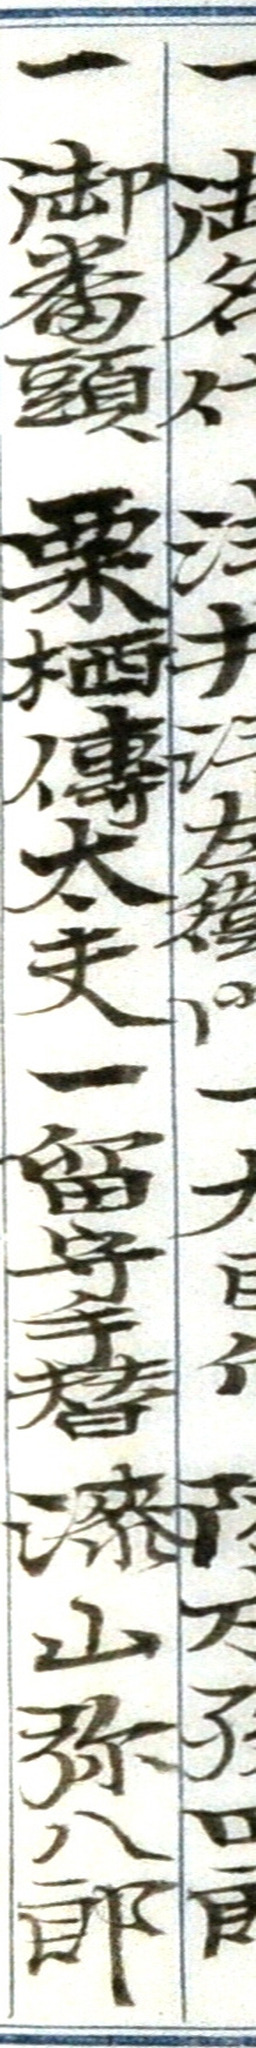一御番頭栗栖傳太夫一留守手替漆山弥八郎

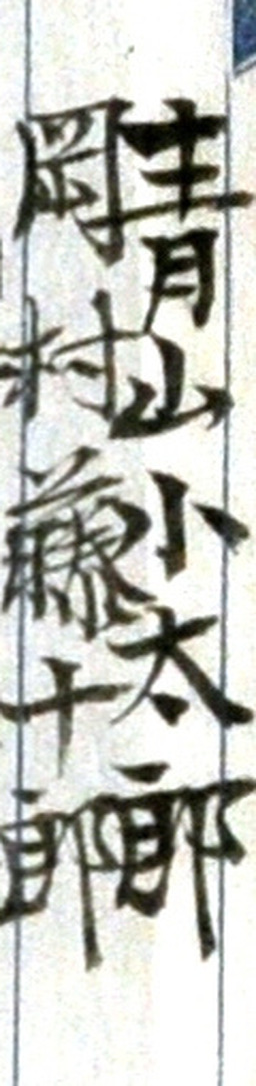岡村藤十郎
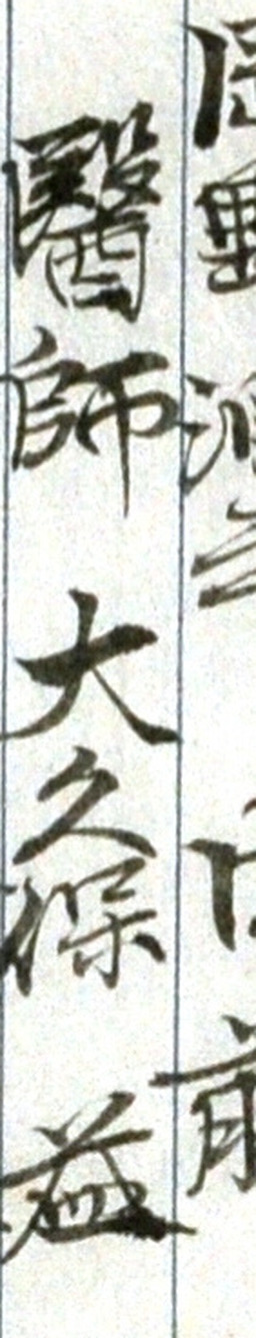医師大久保益
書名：和宮様御下向ニ付御警固人数
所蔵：伊那市立高遠町図書館・合同会社AMANE
